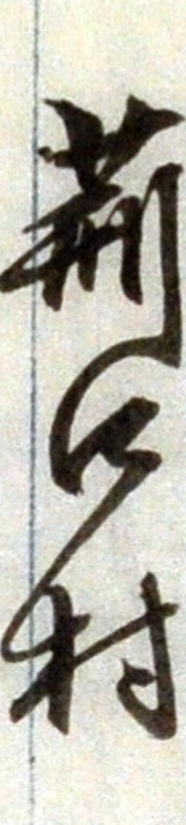溝口村
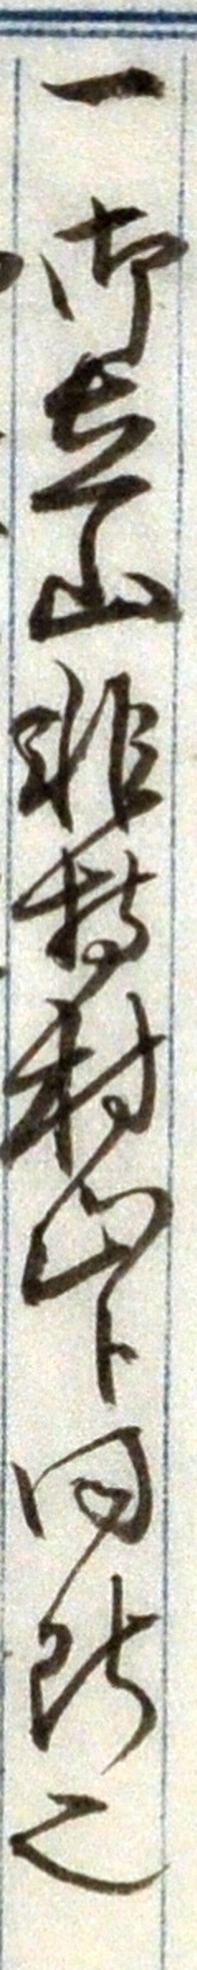一御立山非持村山ト同断也
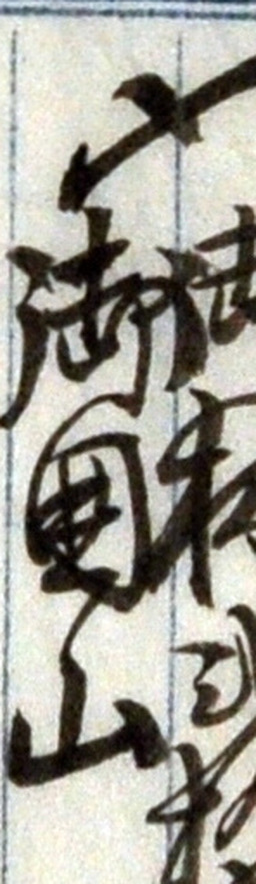御囲山
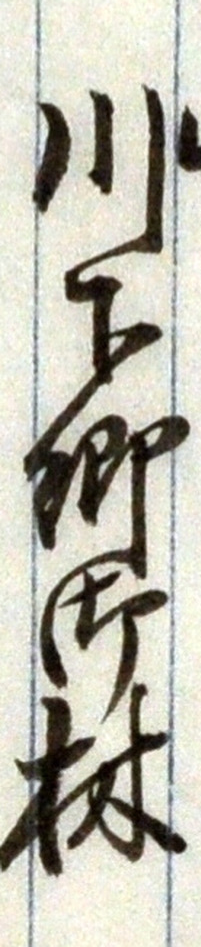川下郷御林
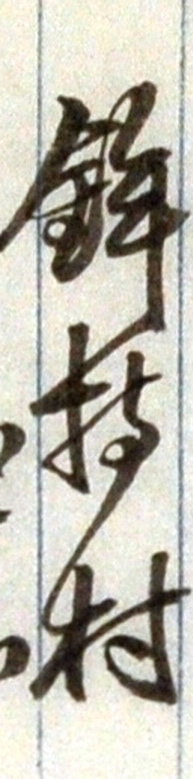鉾持村
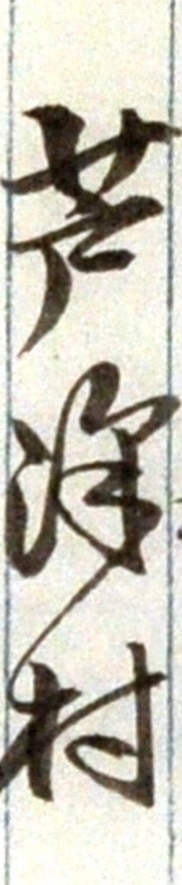芦澤村

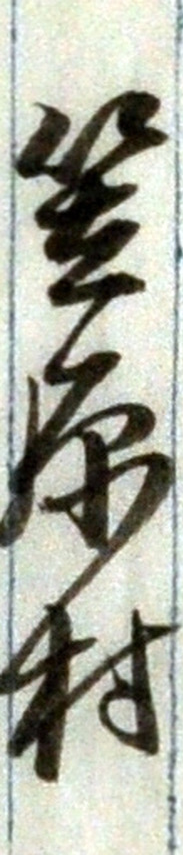笠原村
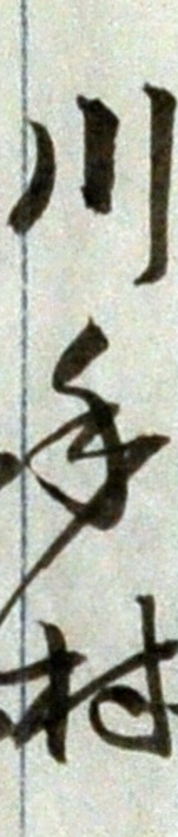川手村
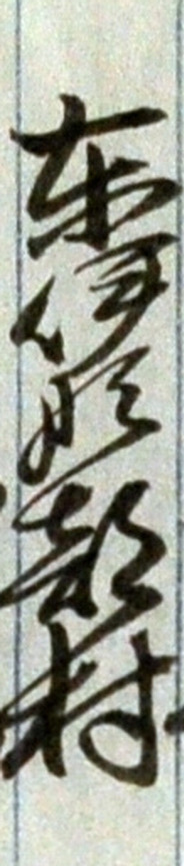東伊那部村
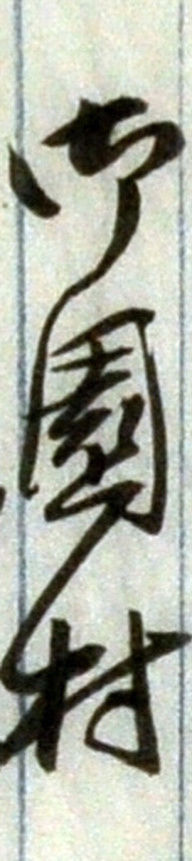御園村
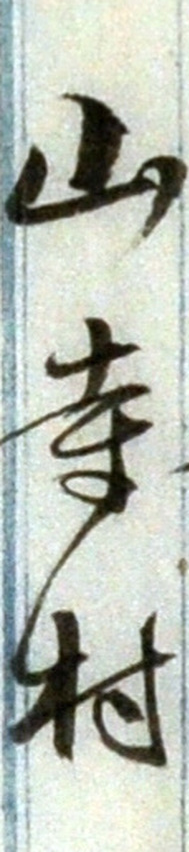山寺村
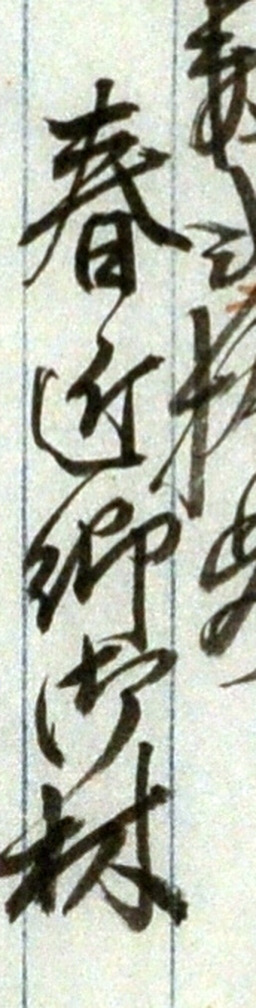春近郷御林
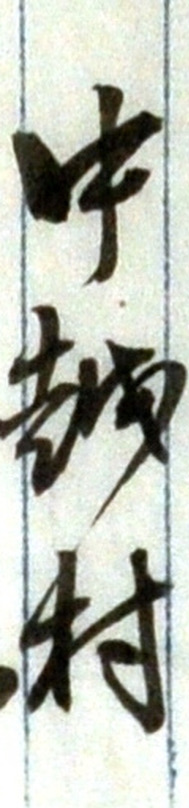中越村
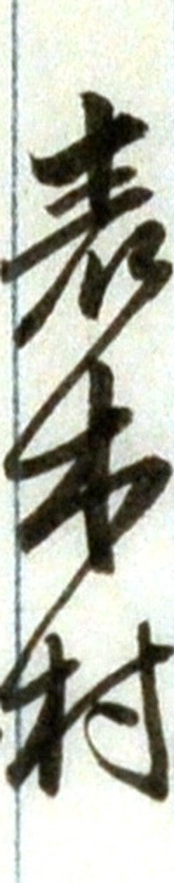表木村
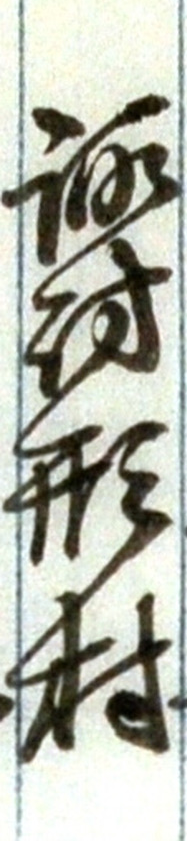諏訪形村

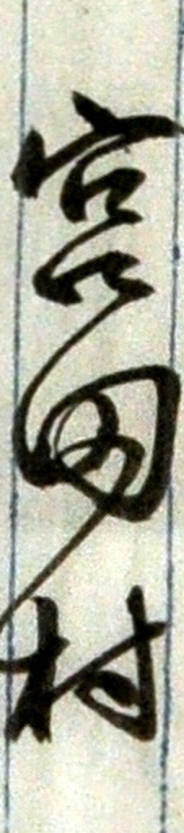宮田村
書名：御山帳
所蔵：伊那市立高遠町図書館・合同会社AMANE
